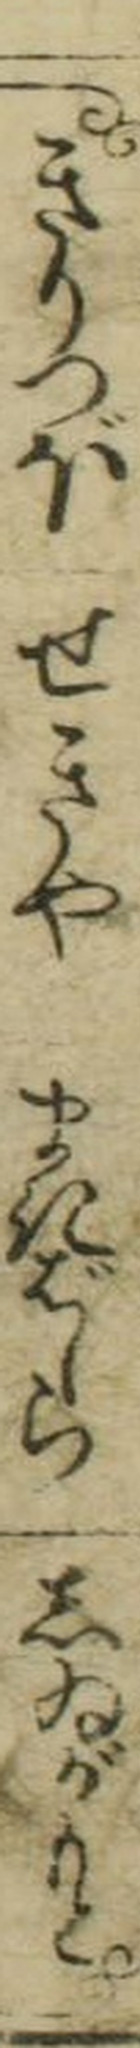きりつぼせきやまきばしらしゐがもと
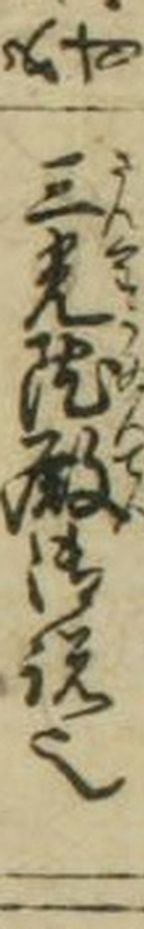三光院殿御説也
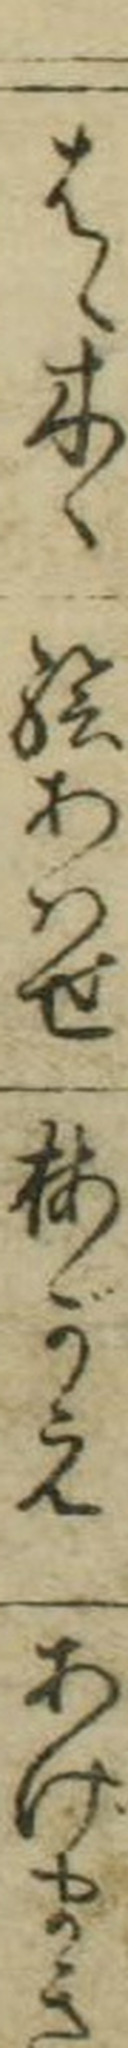はゝきゝ絵あはせ梅がえあげまき
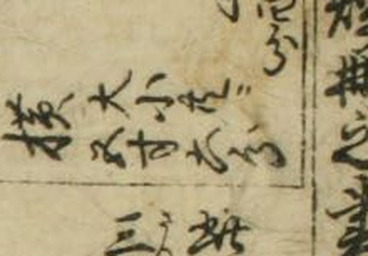横大小共に
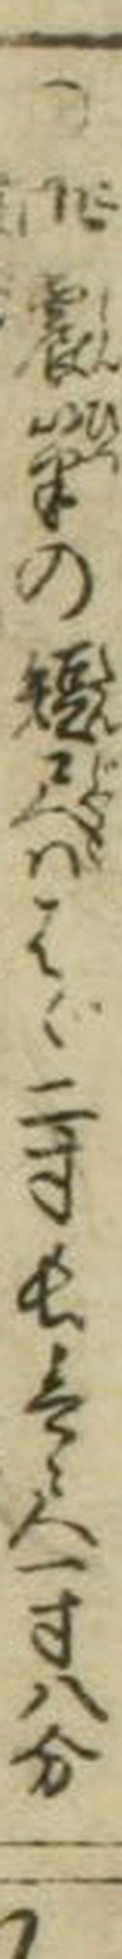○御宸筆の短尺ははゞ二寸長壱尺一寸八分
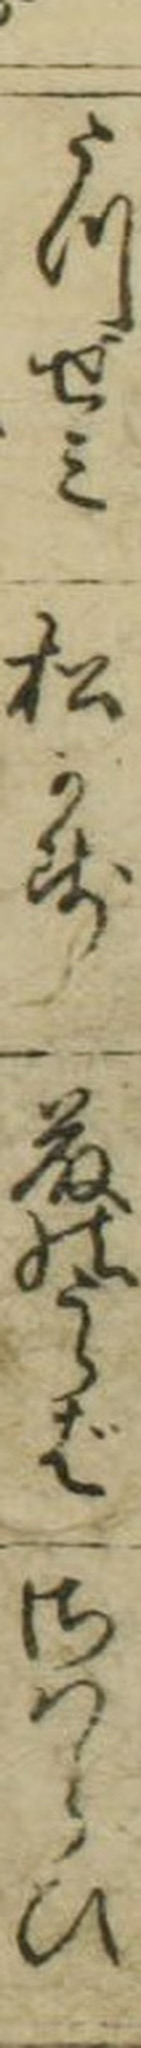うつせみ松かせ藤のうらばさはらび
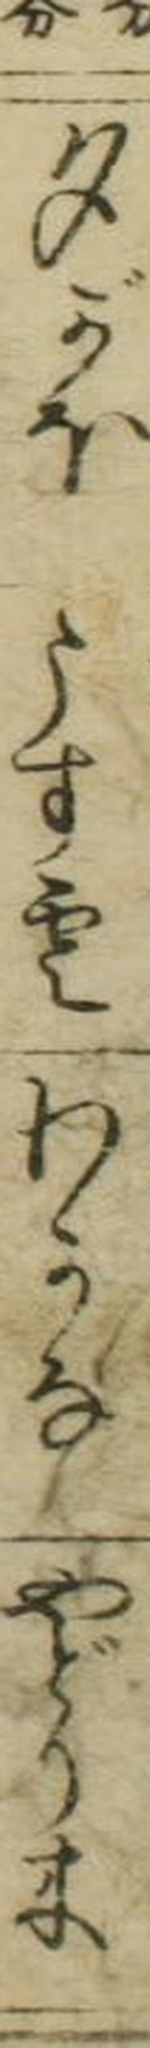夕がほうす雲わかなやどり木
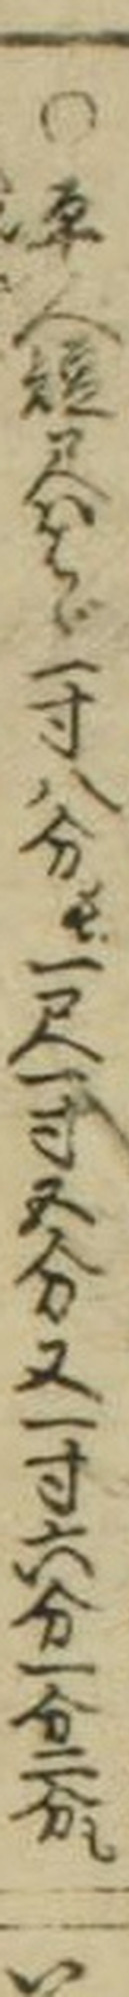○平人短尺ははゞ一寸八分長一尺一寸五分又一寸六分一分二分も
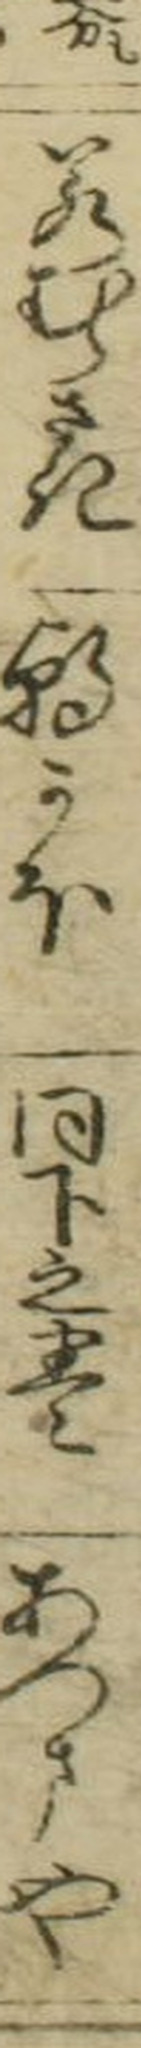若むらさき朝かほ同下之巻あつまや
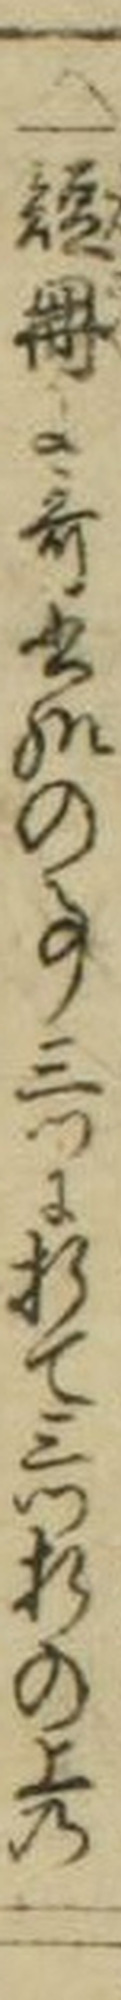△短冊に哥書様の事三つに折て三つ折の上の
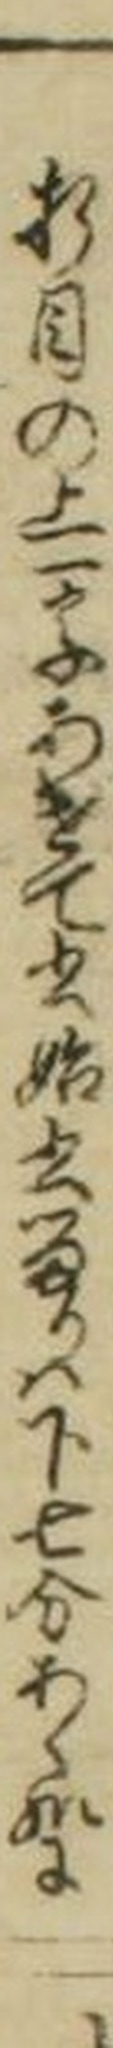折目の上一字あけて書始書留りは下七分あく様に
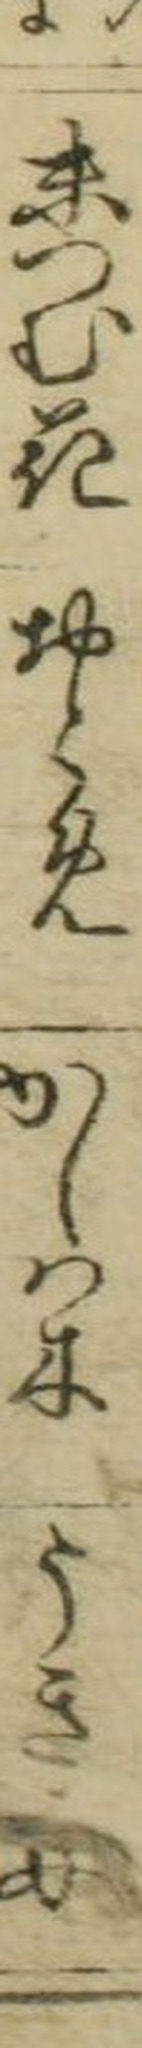末つむ花おとめかしは木うき舟
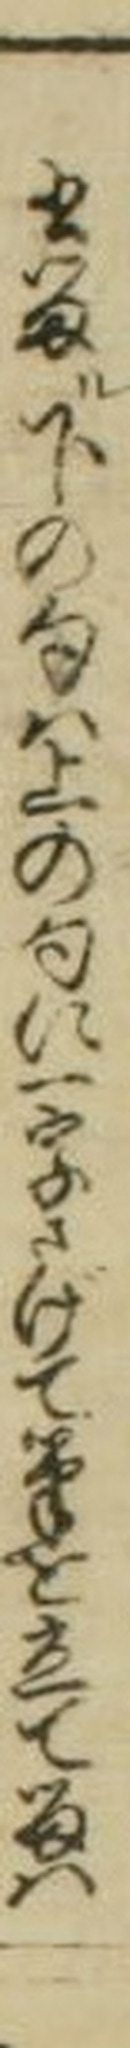書留ル下の句は上の句に一字さげて筆を立て留は
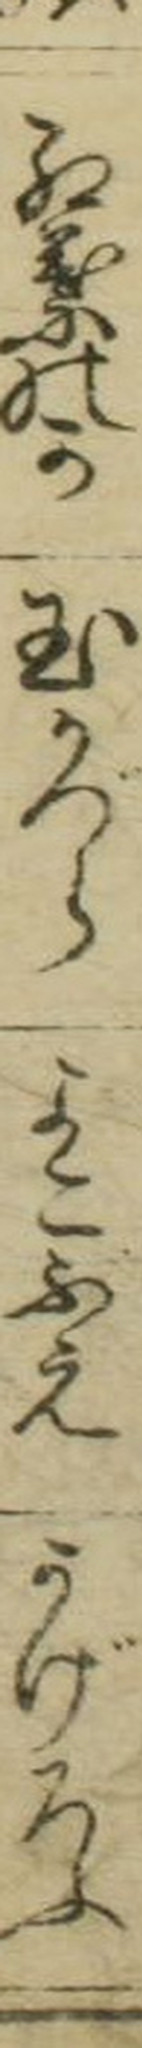紅葉のか玉かづらよこぶえかげろふ
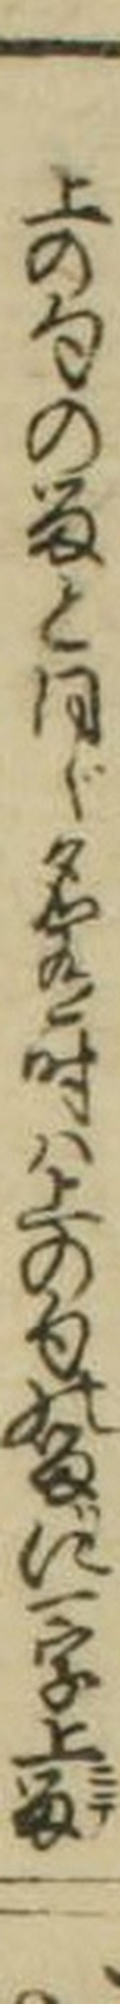上の句の留と同じ名有時は上の句の留りに一字上にて留
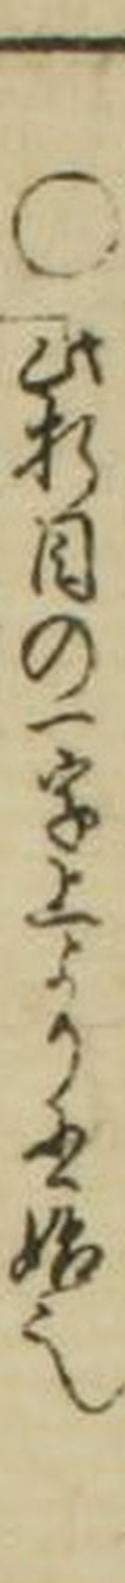○此折目の一字上より書始也
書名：女源氏教訓鑑
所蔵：東京学芸大学附属図書館
